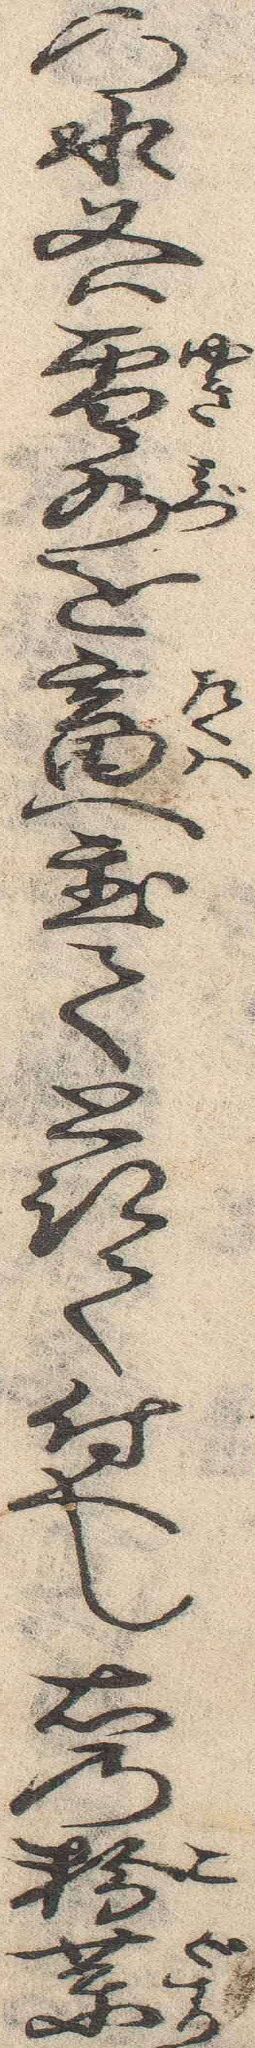の水又は雪水を畜へ置てときて付へし右の粉薬
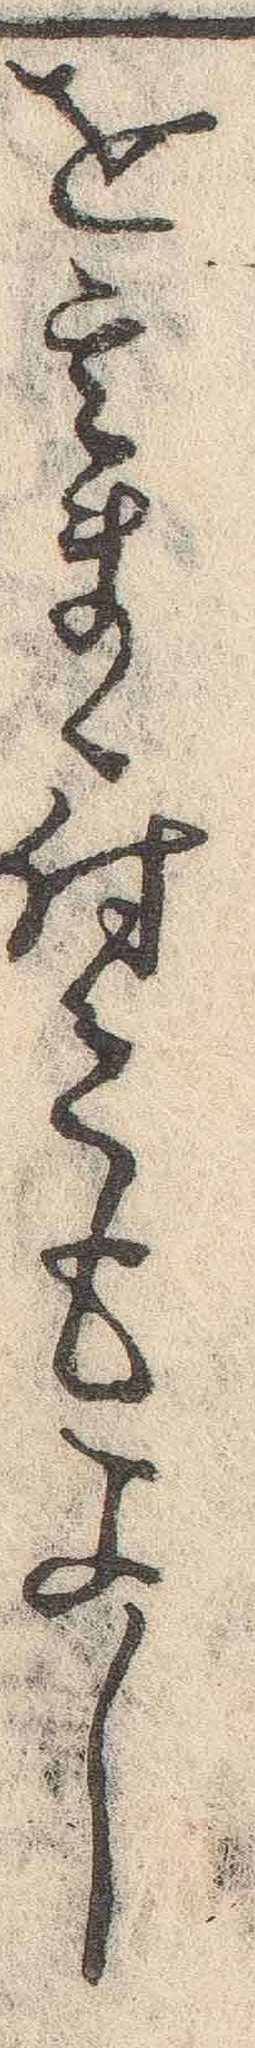を其まゝ付てもよし
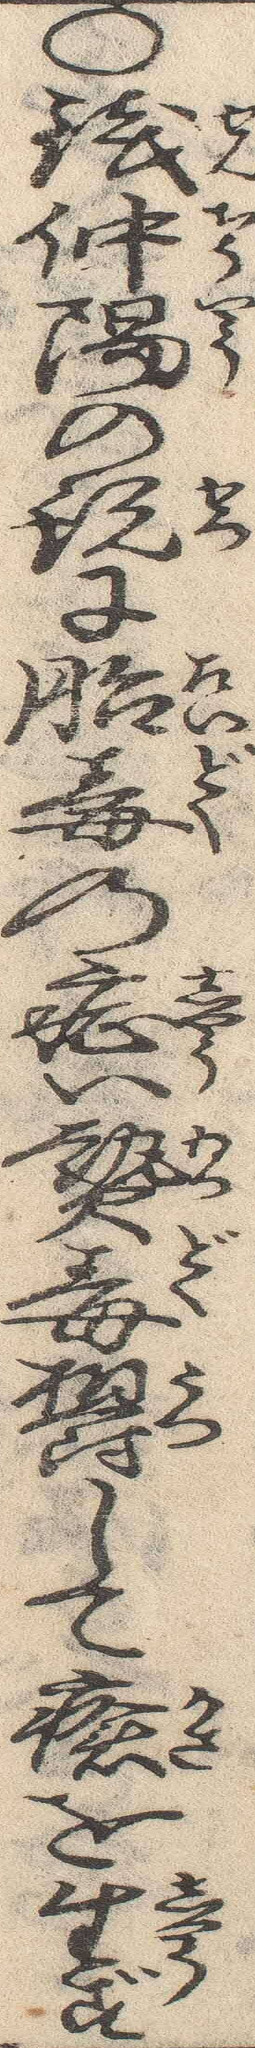○銭仲陽の説に胎毒の症は熱毒鬱して瘡を生ず
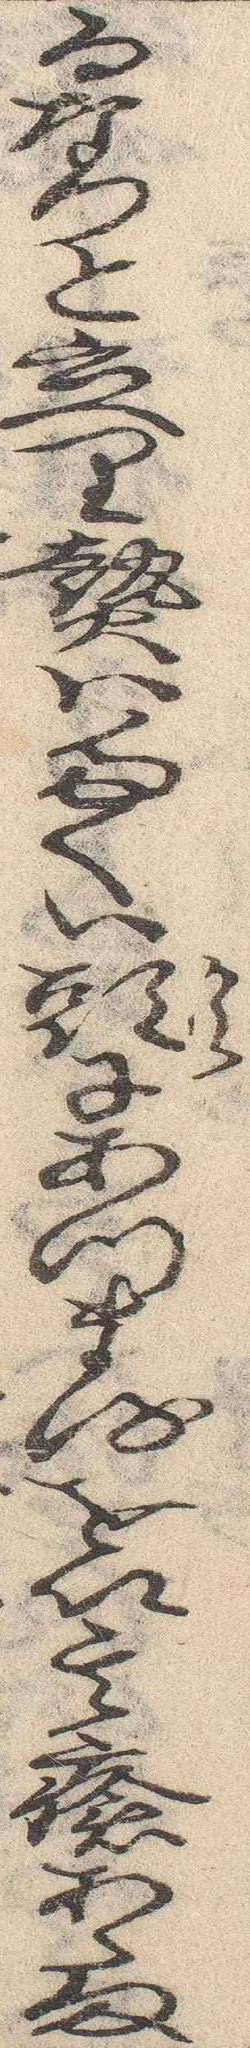るなりと云へり熱は多くは頭にあつまるを以其瘡あたま
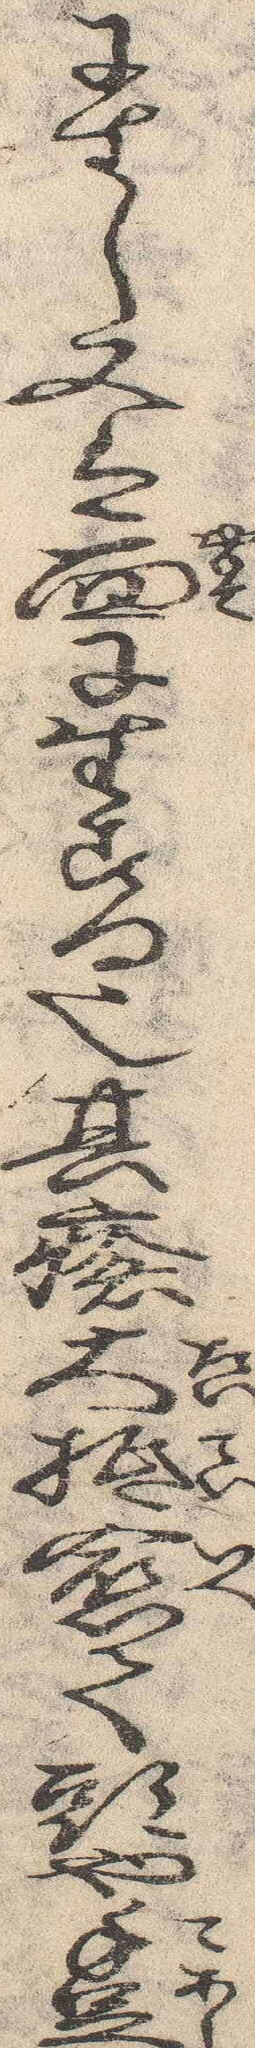に生し又は面に生する也其瘡大抵愈て頭や手足
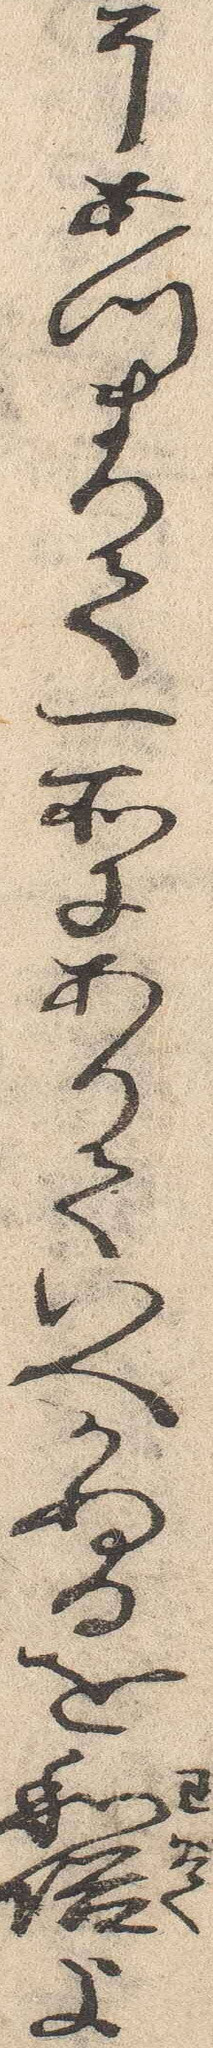にあつまりて一所にありていへかぬるを和俗よ
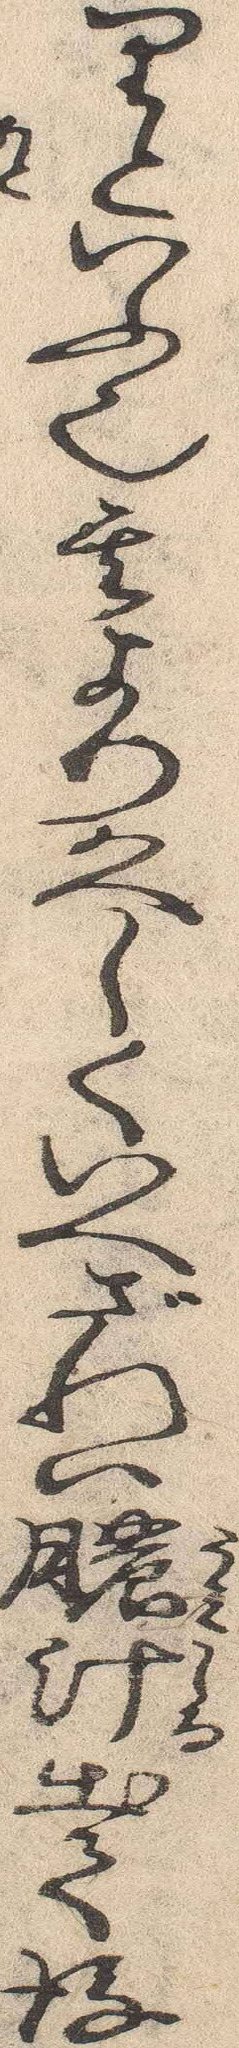りといふ也其より久しくいへざれは膿汁出て後
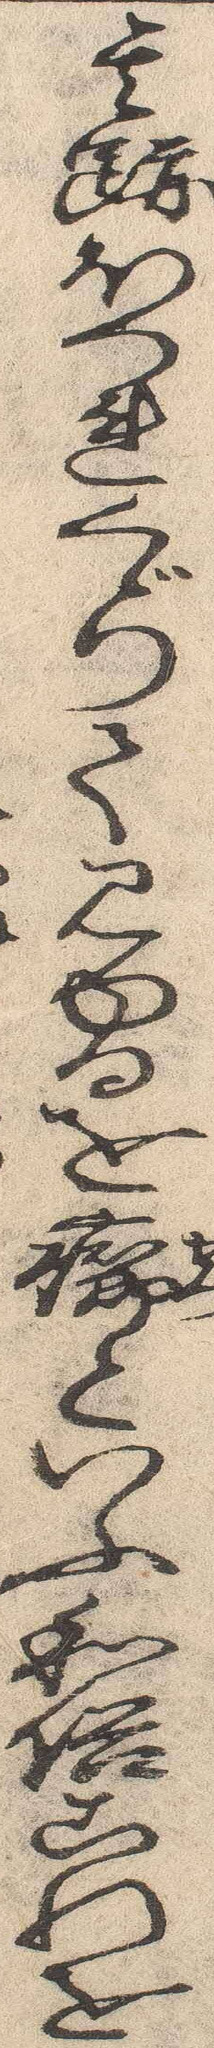其跡ほつれくゞりて見ゆるを癤といふ和俗これを
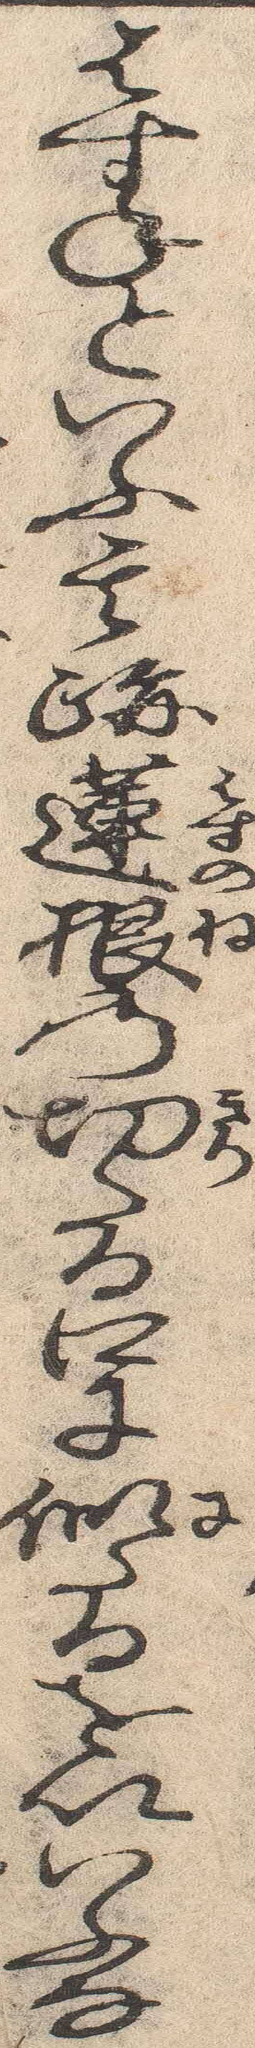はすねといふ其跡蓮根の切たる口に似たるを以いふな
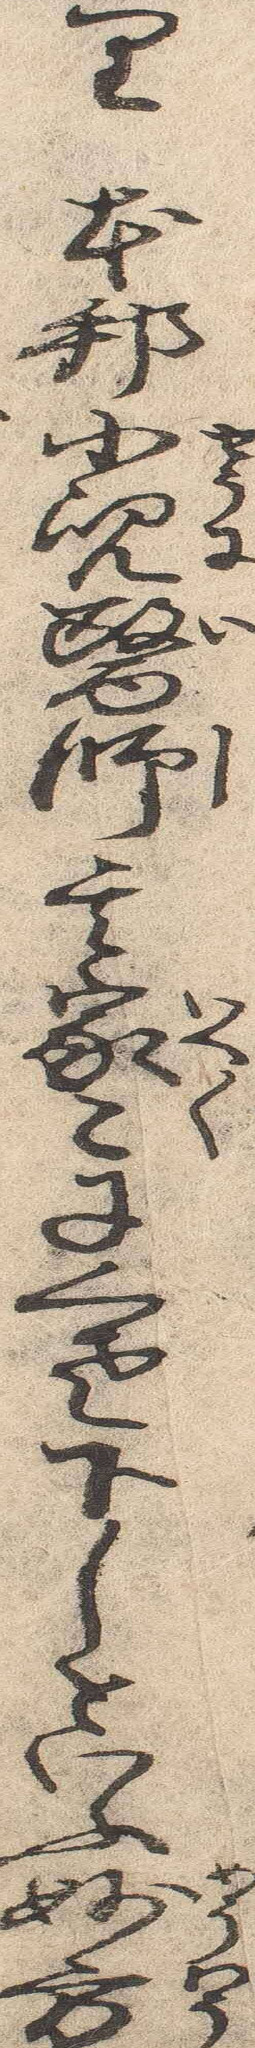り本邦小児医師其家々にくせ下しといふ妙方
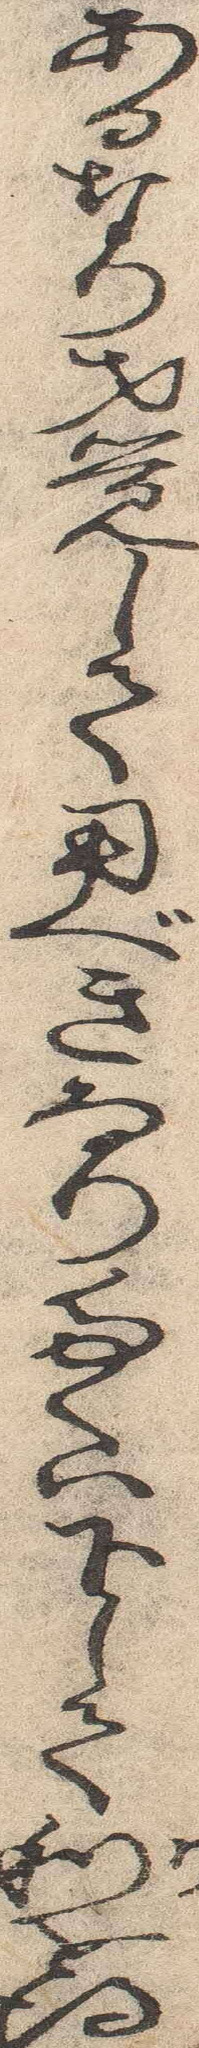あるなり才覚して用べきなり多くは下して利を得
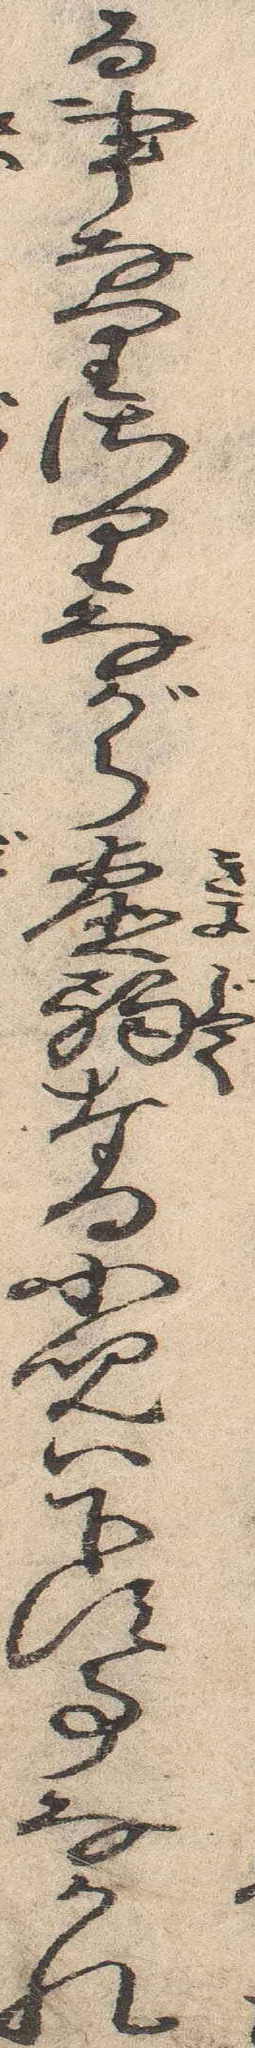る事なりさりながら虚弱なる小児は下す事なかれ
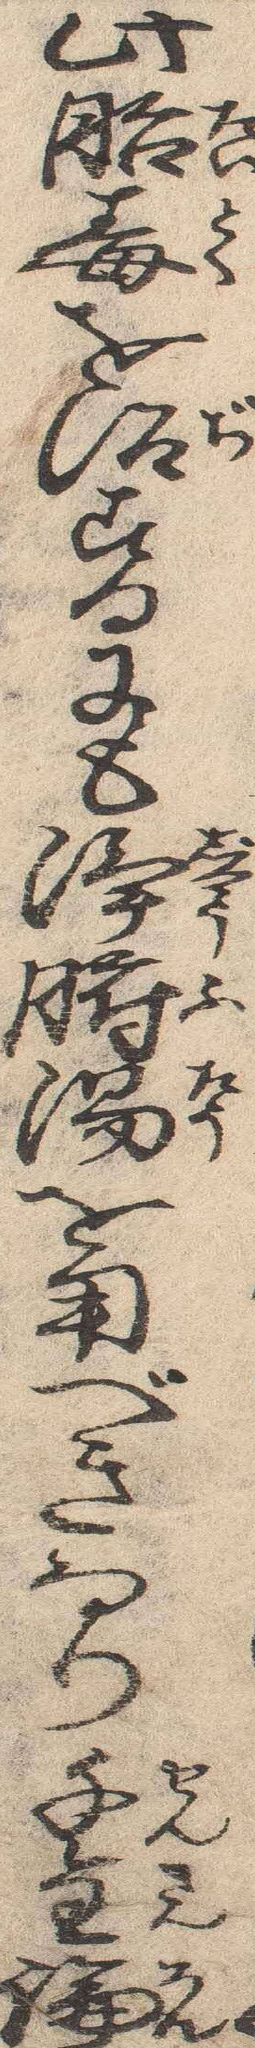此胎毒を治するにも浄腑湯を用べきなり千金論
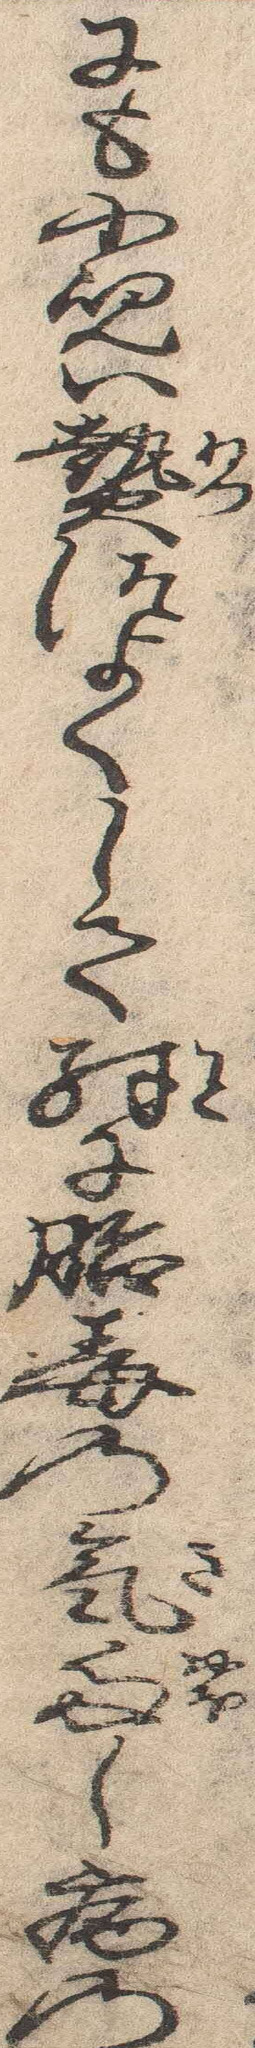にも小児は熱つよくして殊に胎毒の気多し病の
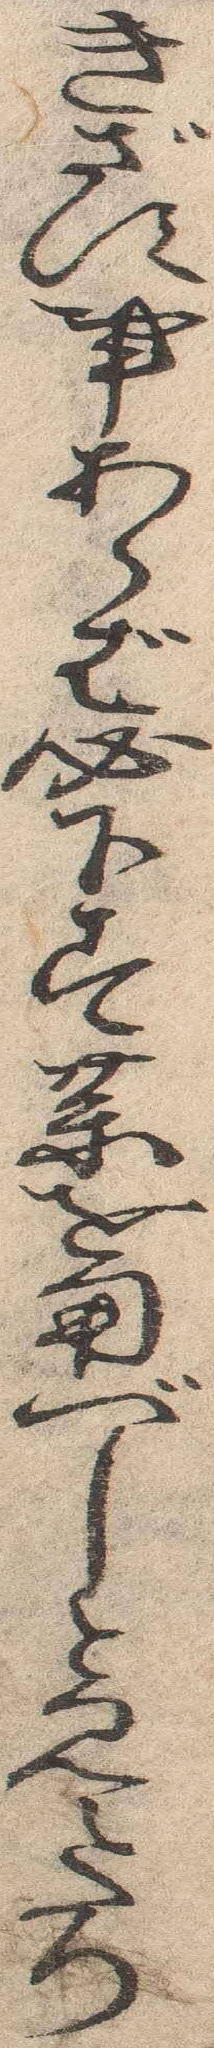きざす事あらば必下す薬を用べしと見えたり
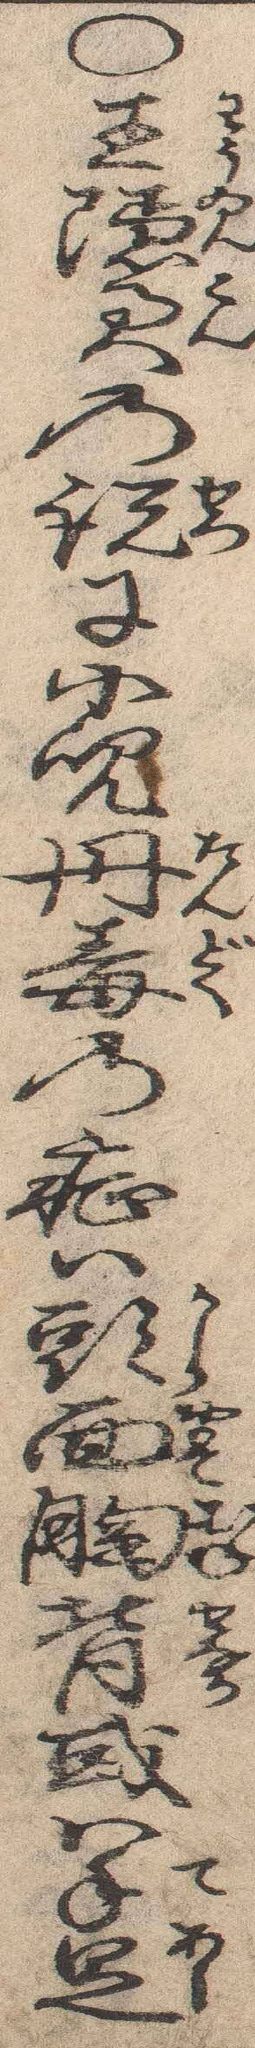○王隠君の説に小児丹毒の症は頭面胸背或は手足
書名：小児必用養育草
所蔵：東京学芸大学附属図書館 国文学研究資料館
